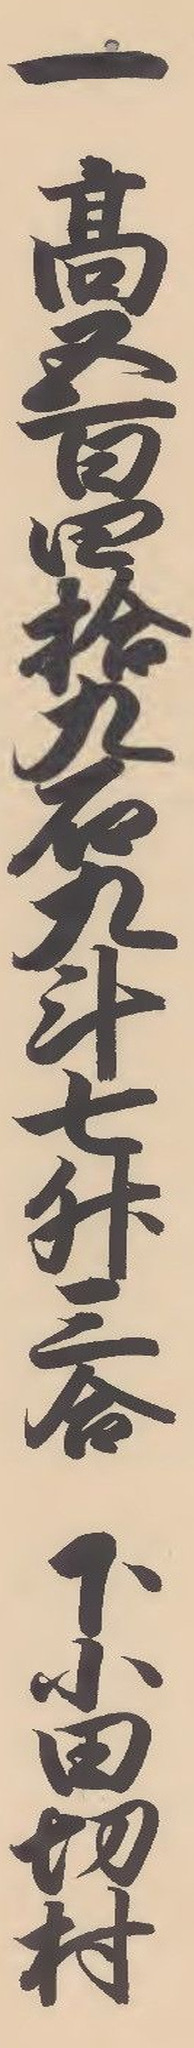一高五百四拾九石九斗七升三合下小田切村
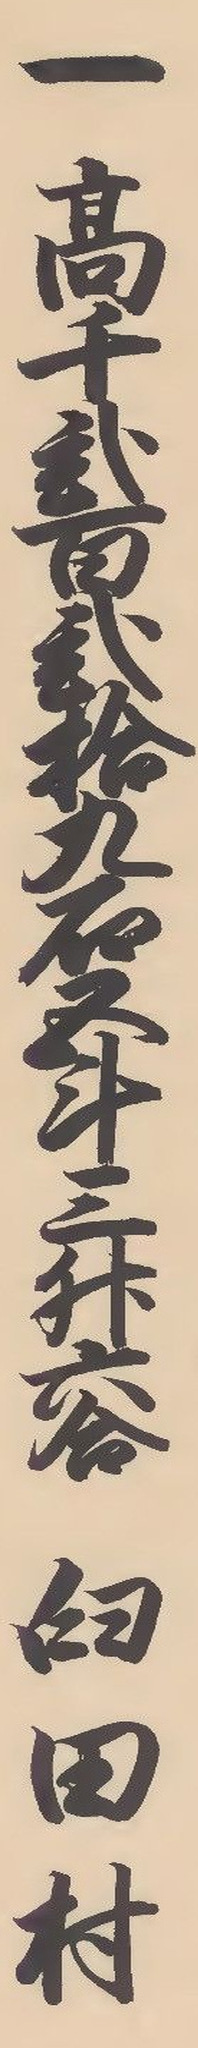一高千弐百弐拾九石五斗三升六合臼田村

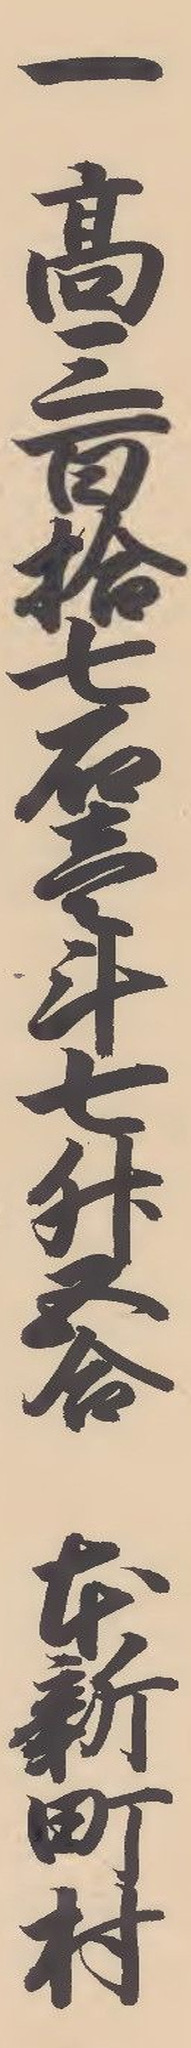一高三百拾七石壱斗七升五合本新町村
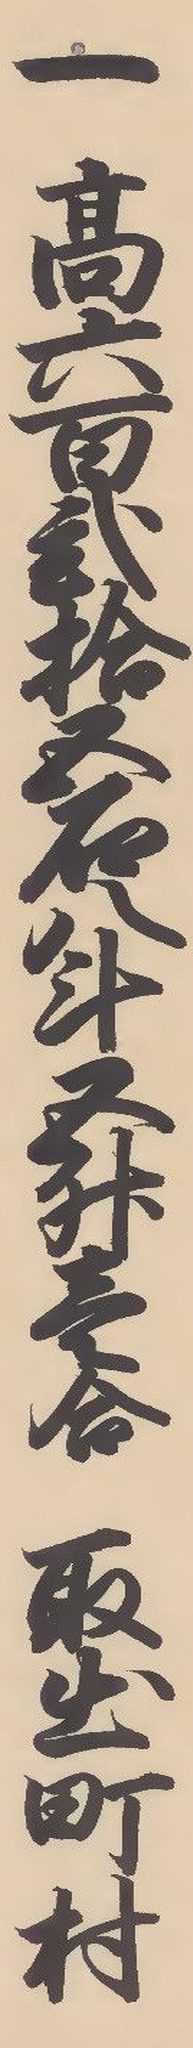一高六百弐拾五石八斗五升壱合取出町村
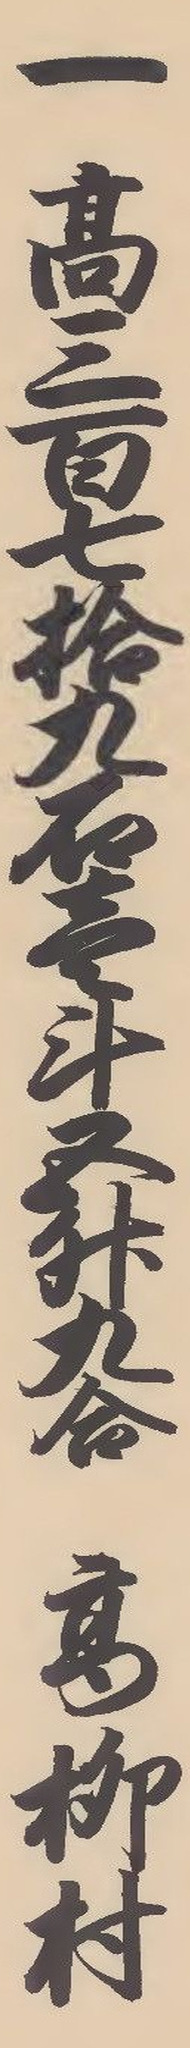一高三百七拾九石壱斗五升九合高柳村
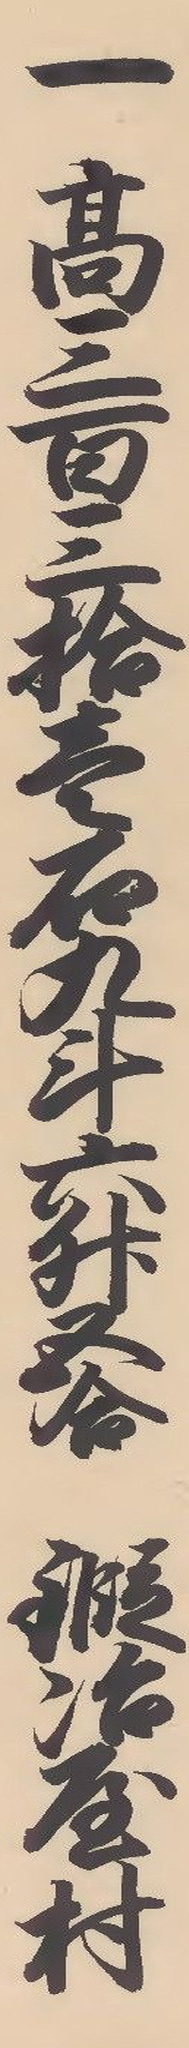一高三百三拾壱石九斗六升五合鍛冶屋村
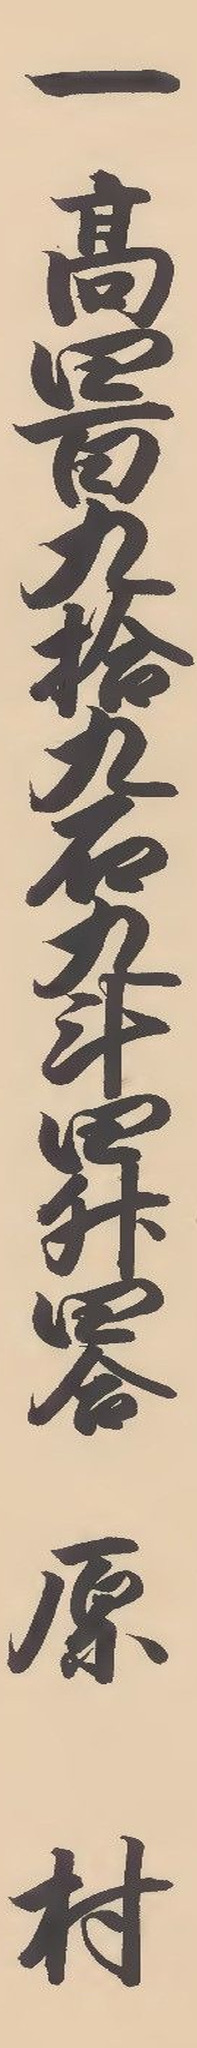一高四百九拾九石九斗四升四合原村
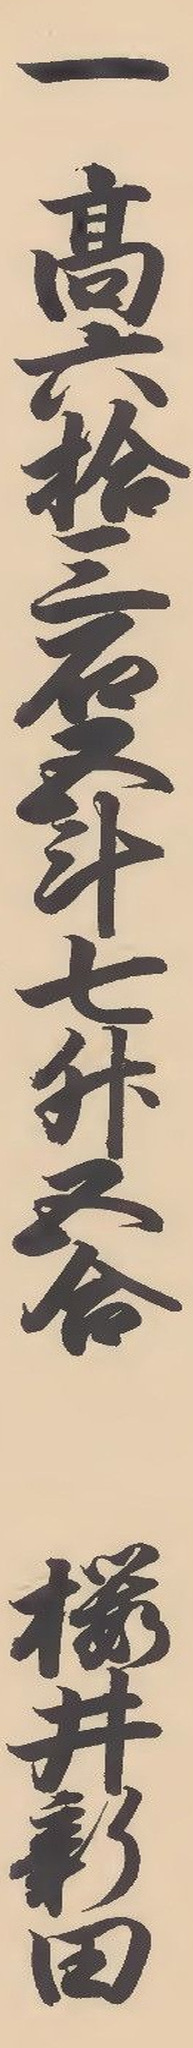一高六拾三石五斗七升五合桜井新田
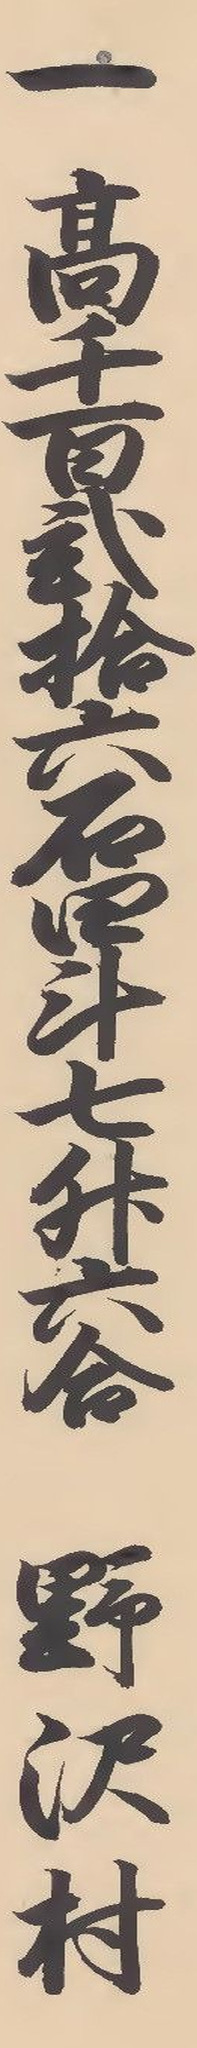一高千百弐拾六石四斗七升六合野沢村
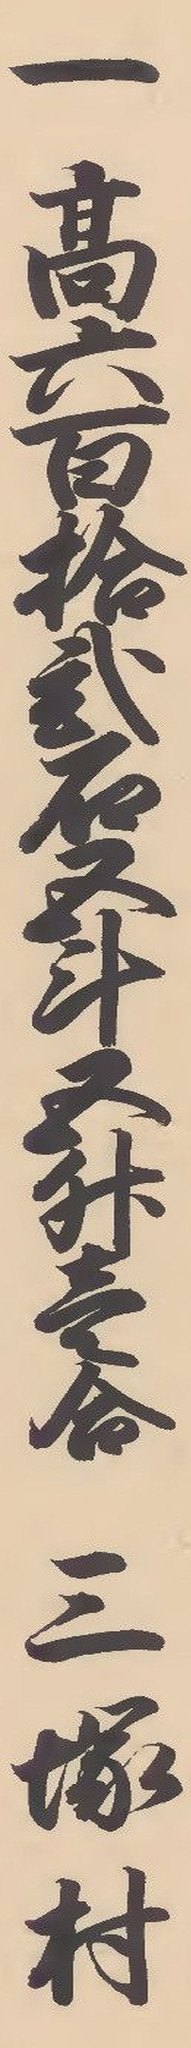一高六百拾弐石五斗五升壱合三塚村

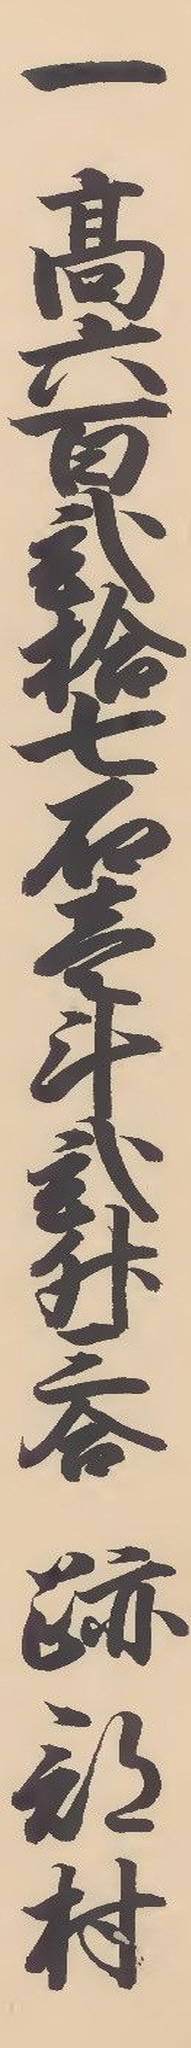一高六百弐拾七石壱斗弐升三合跡部村
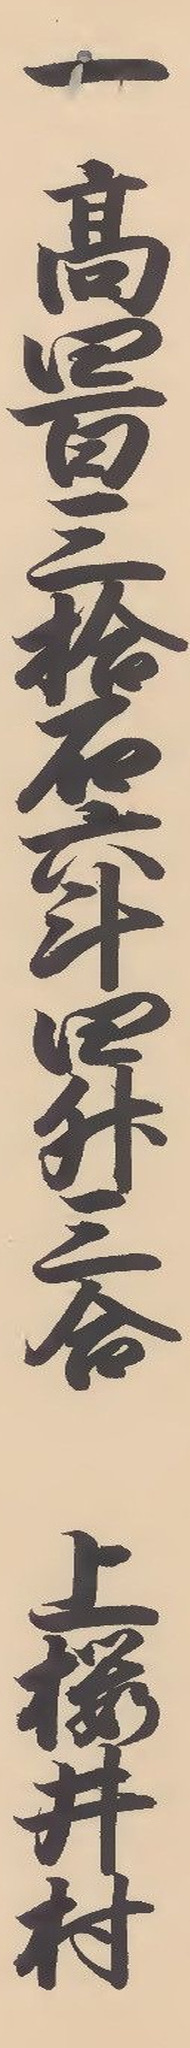一高四百三拾石六斗四升三合上桜井村
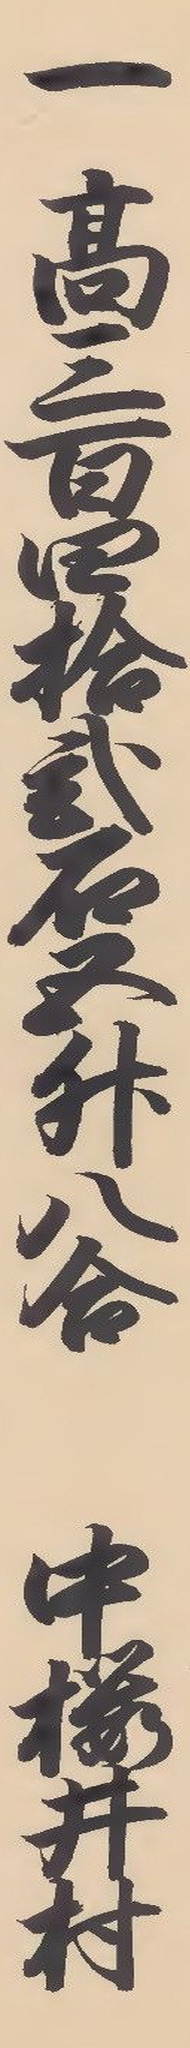一高三百四拾弐石五升八合中桜井村
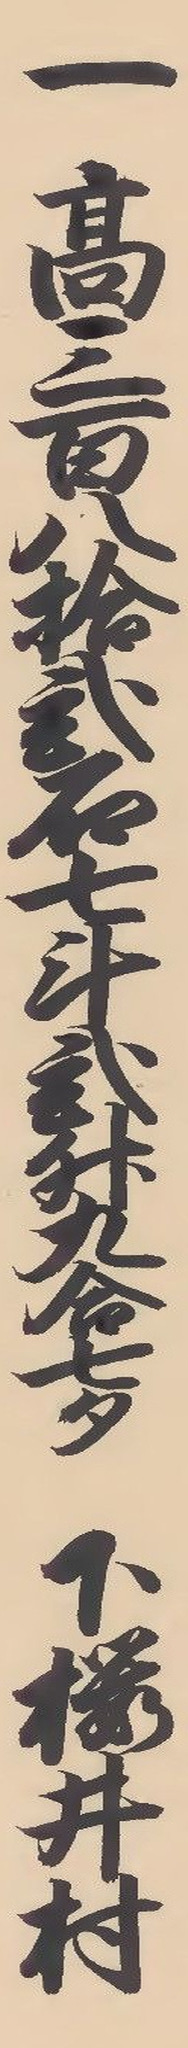一高三百八拾弐石七斗弐升九合七勺下桜井村
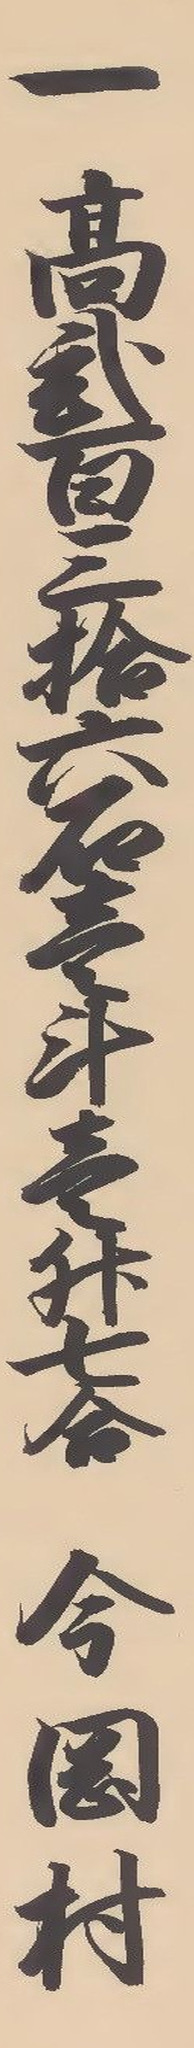一高弐百三拾六石壱斗壱升七合今園村
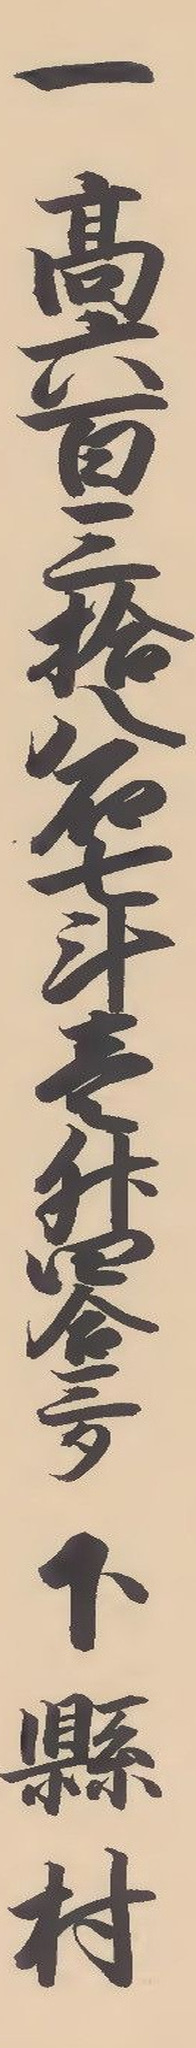一高六百三拾八石七斗壱升四合三勺下県村
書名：信濃国郷帳
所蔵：国立公文書館 National Archives of Japan
